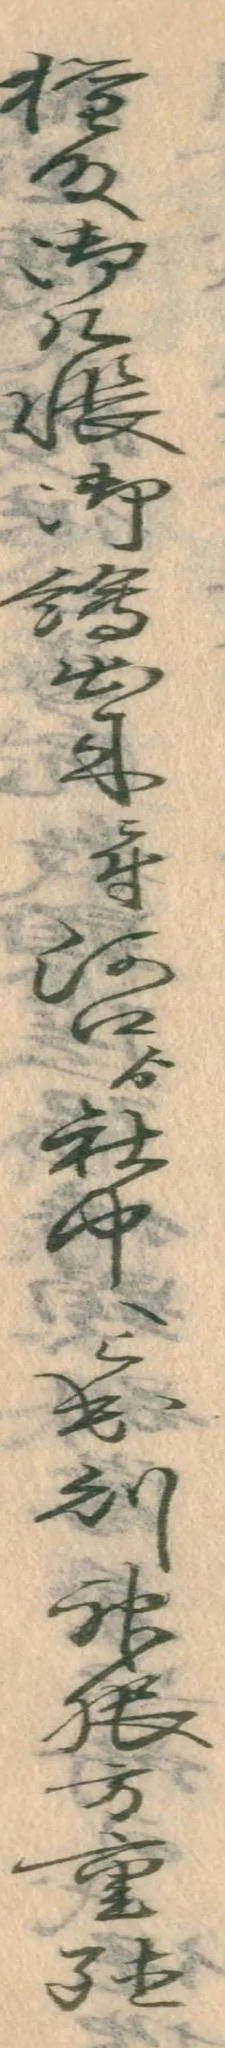一権殿御几帳御絵出来ニ付河口ゟ社中へ被出則神服方重殖
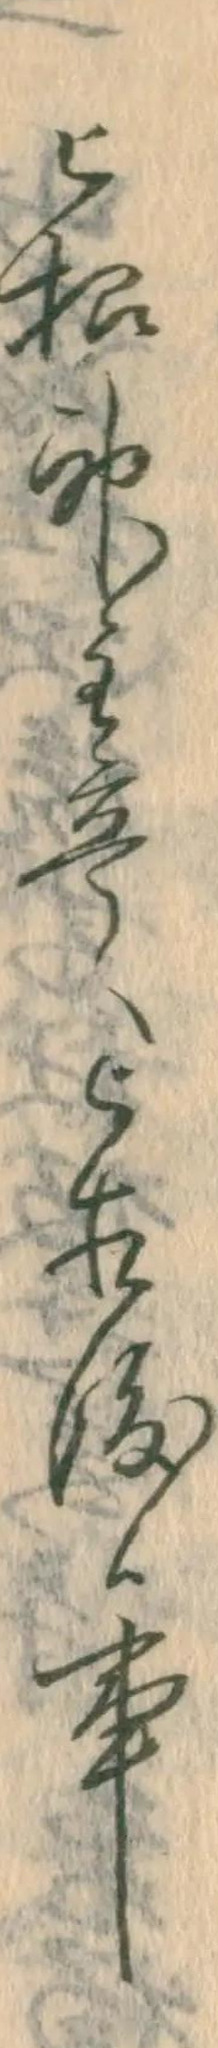被招神主亭へ被相渡候事
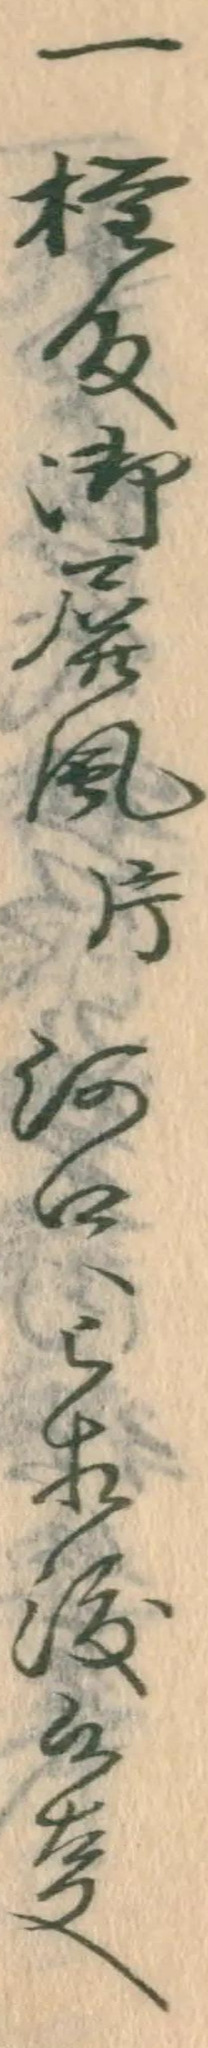一権殿御屏風片河口へ被相渡候事
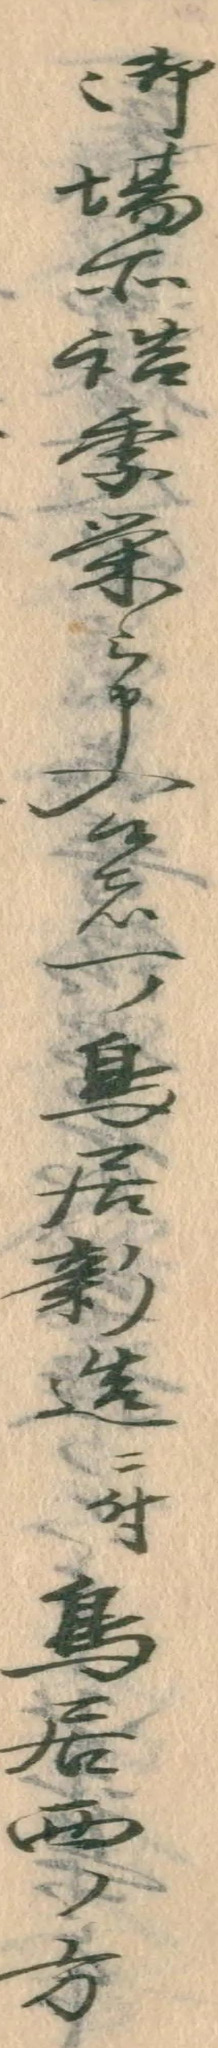一御場所詰季栄被申入候は一ノ鳥居新造ニ付鳥居西ノ方
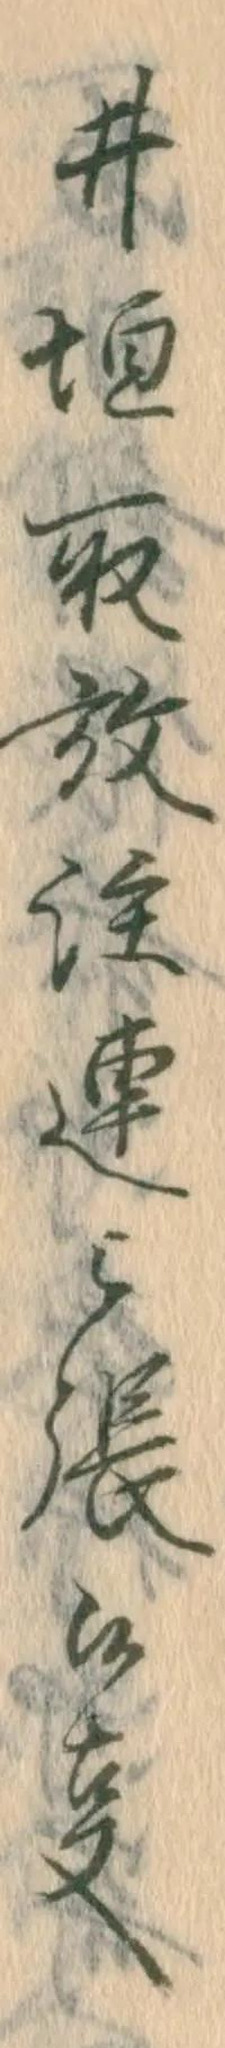井垣取放注連ニ被張候事
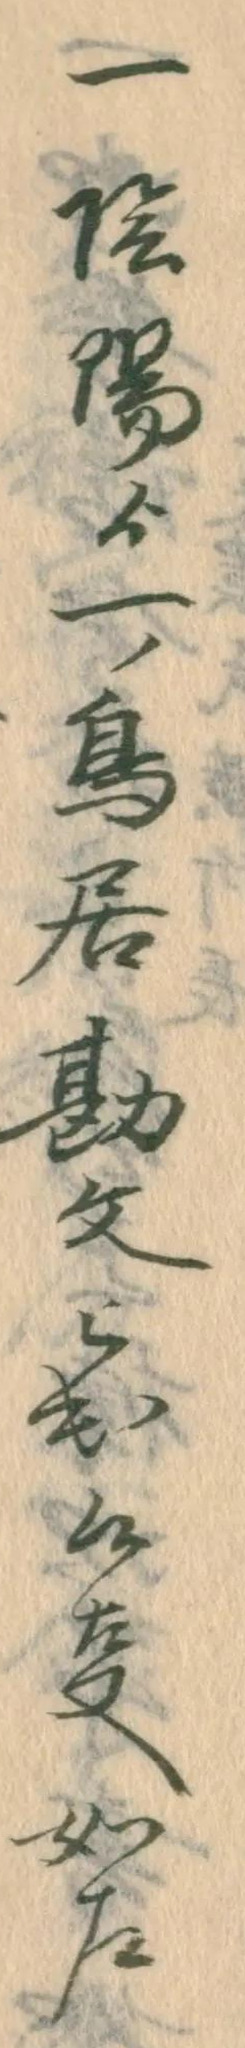一陰陽ゟ一ノ鳥居勘文被出候事如左
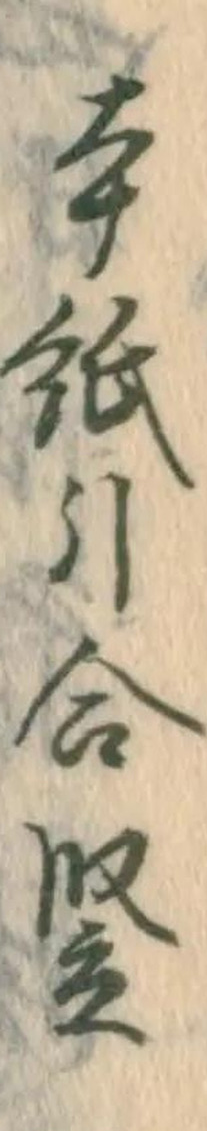本紙引合竪
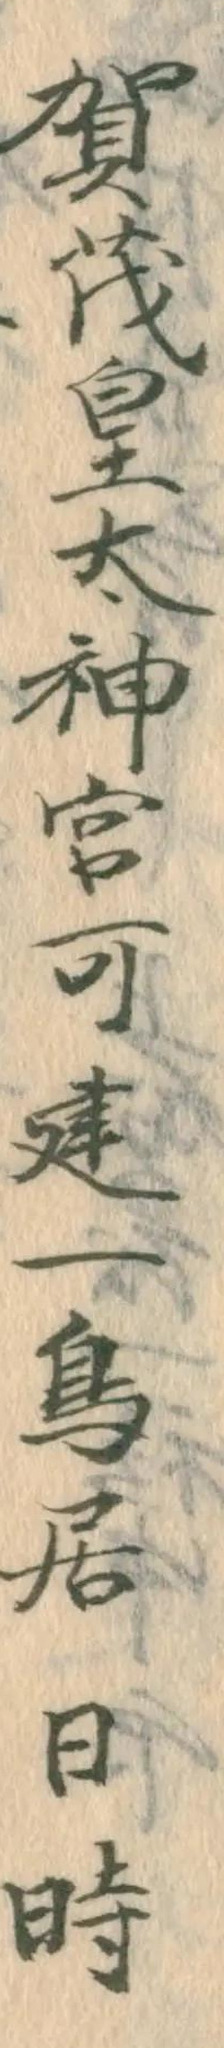賀茂皇太神宮可建一鳥居日時
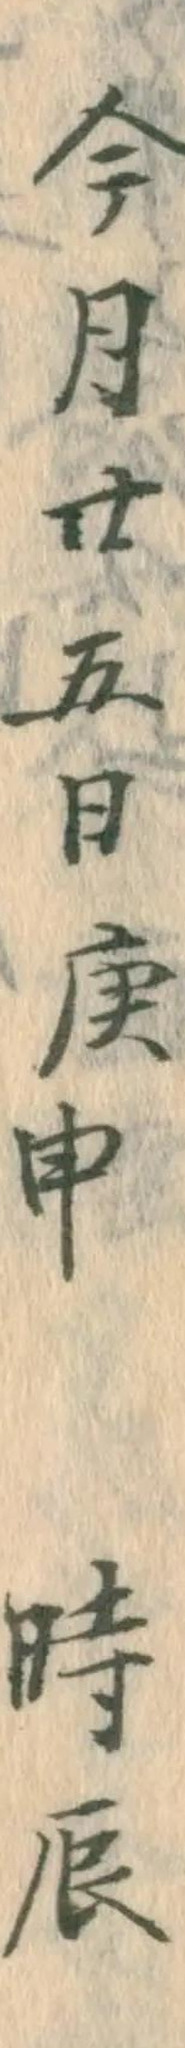今月廿五日庚申時辰
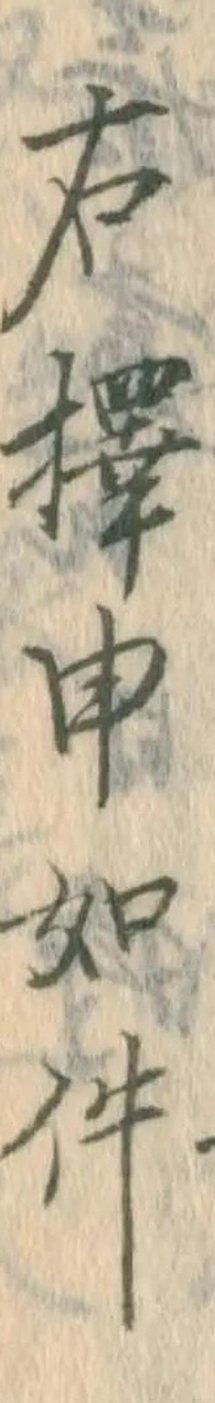右択申如件
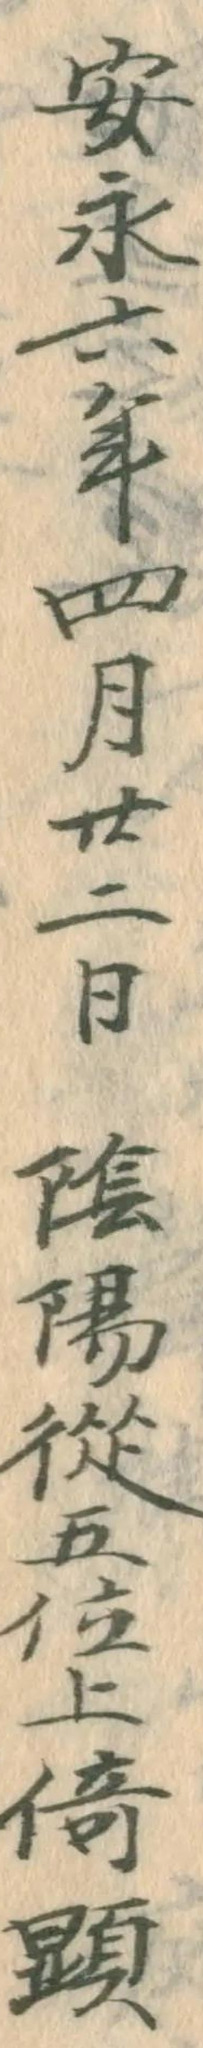安永六年四月廿二日陰陽従五位上倚顕
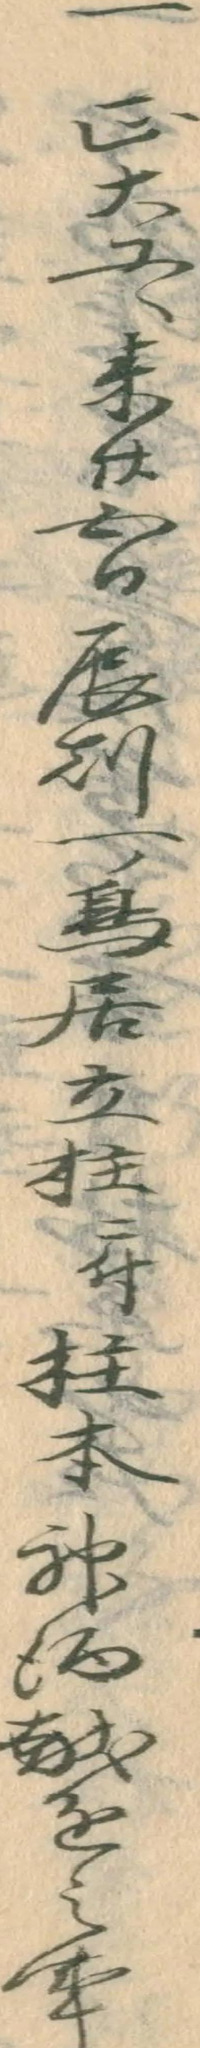一正大工へ来廿五日辰刻一ノ鳥居立柱ニ付柱木神酒献進之事
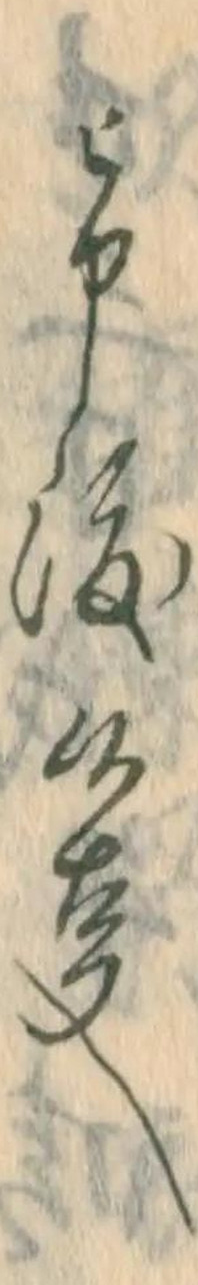被申渡候事

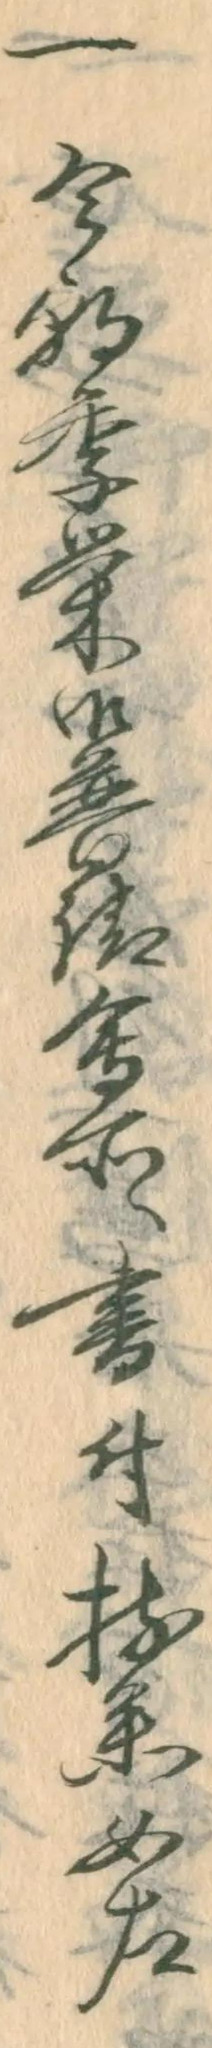一今朝季栄御普請会所へ書付持参如左
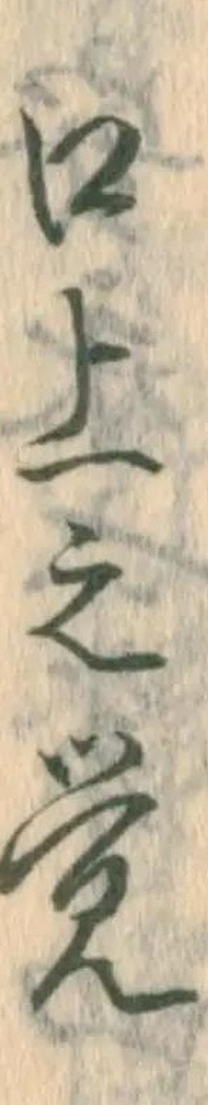口上之覚
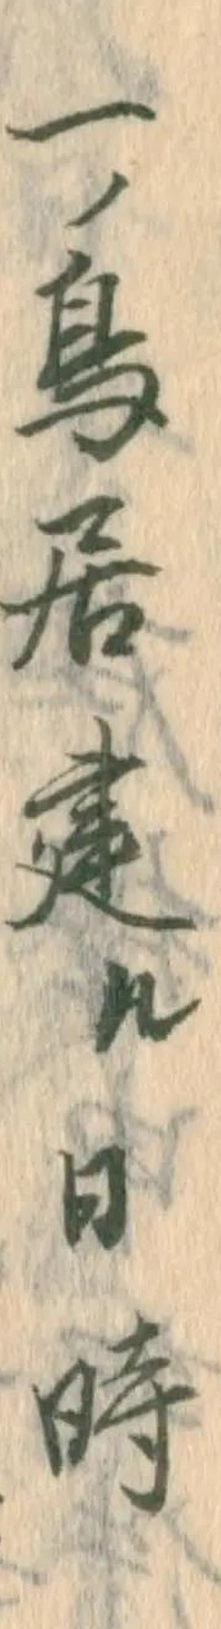一ノ鳥居建ル日時
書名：賀茂社記録. 第17冊
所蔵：国立国会図書館 National Diet Library, JAPAN
